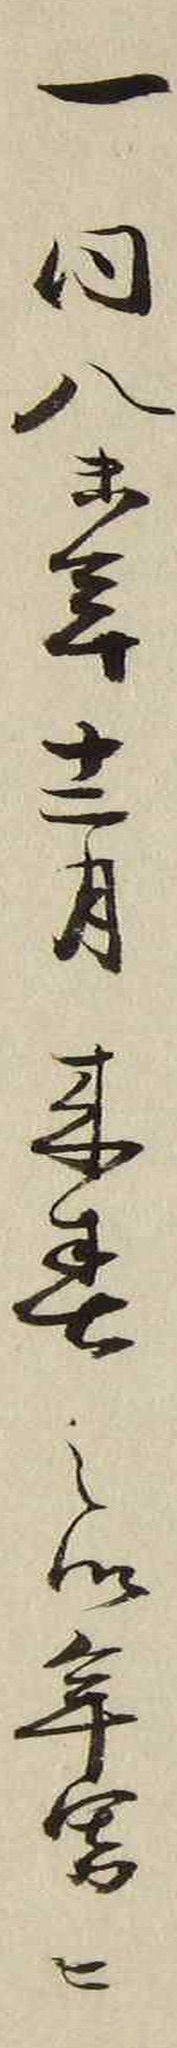一同八未年十二月来春之御年男被
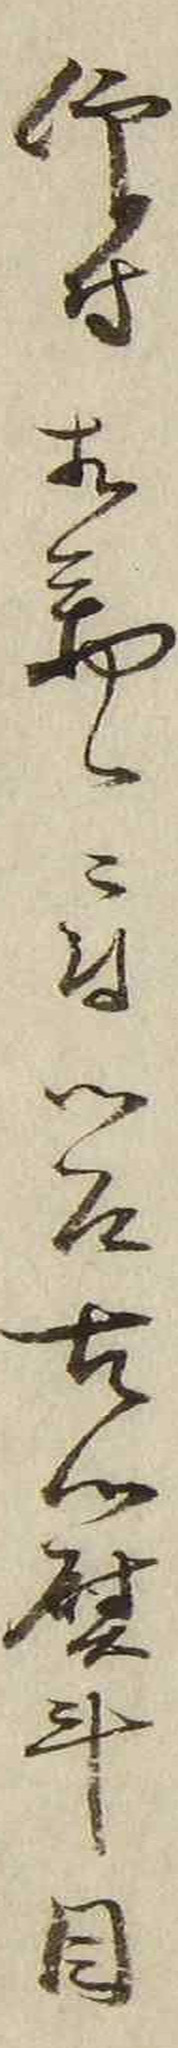仰付相勤候に付お御召古御熨斗目

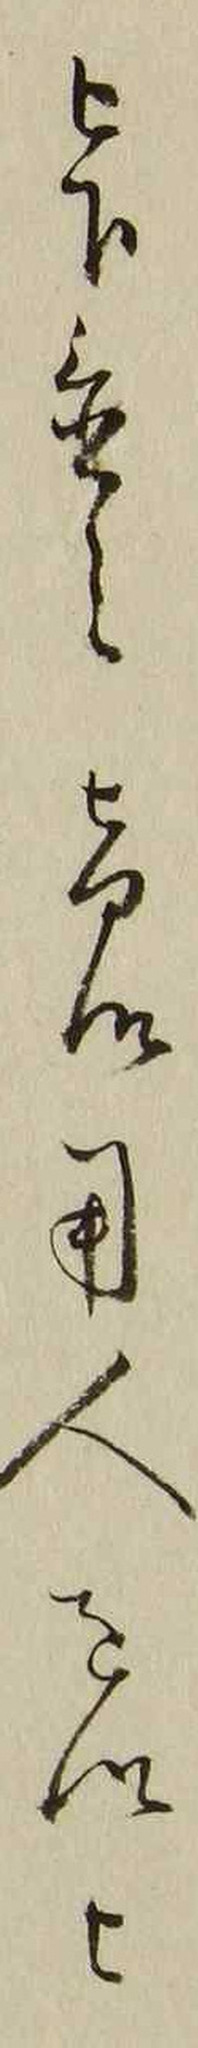被下置之旨御用人を以被
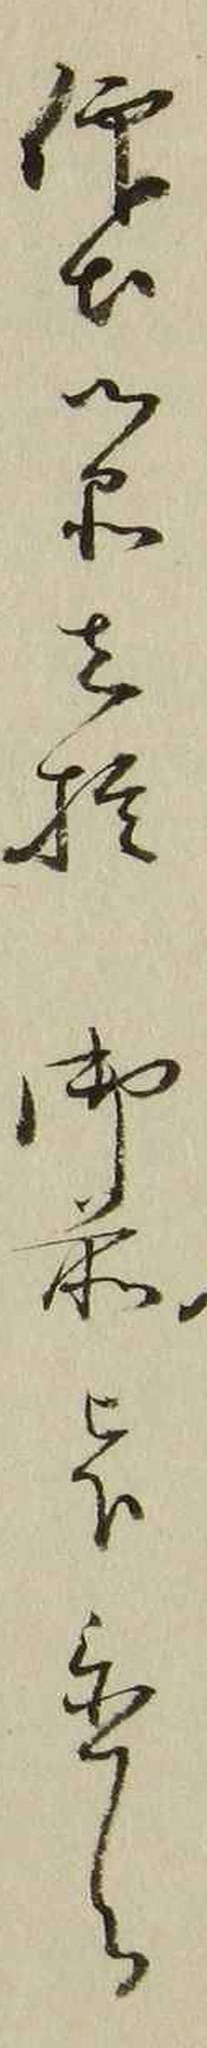仰出御品は於御前被下置候
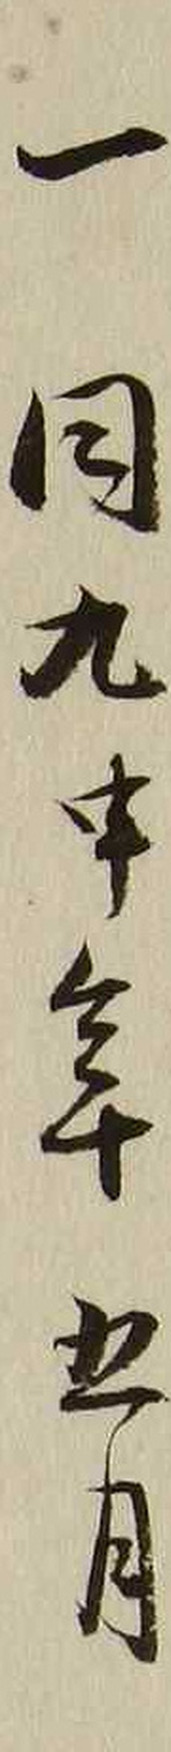一同九申年五月
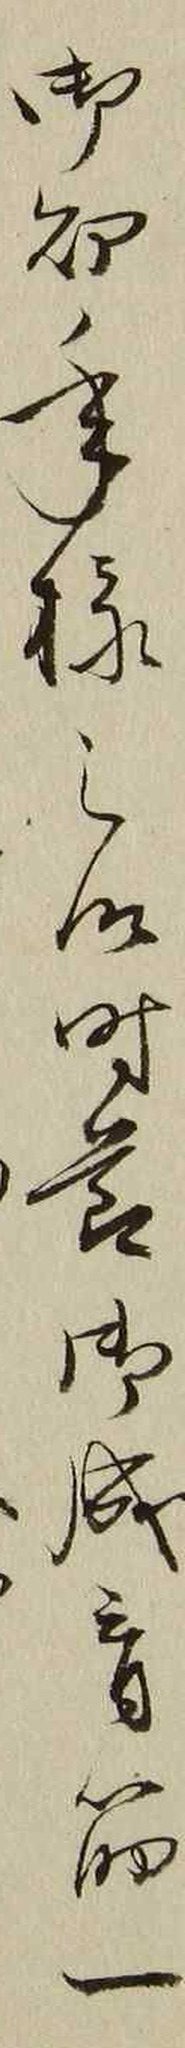御幼年様之御時節御成育筋一
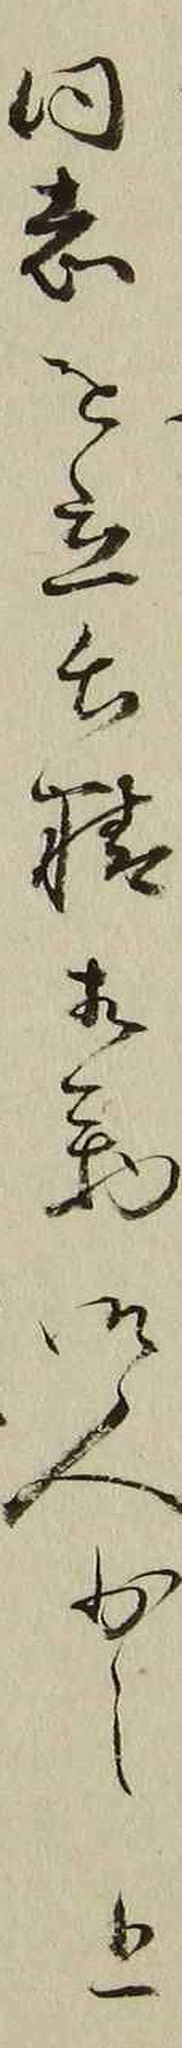同表を立出精相勤御人少之上
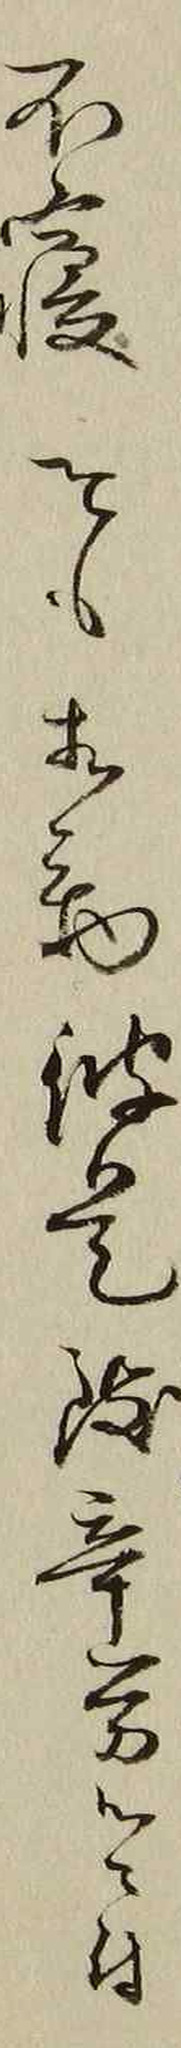不寝をも相勤彼是致辛労候に付
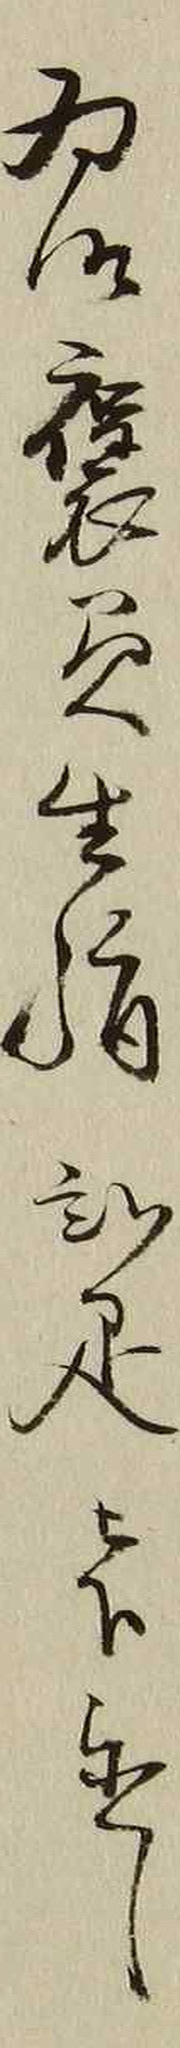為御褒美生絹弐疋被下置候
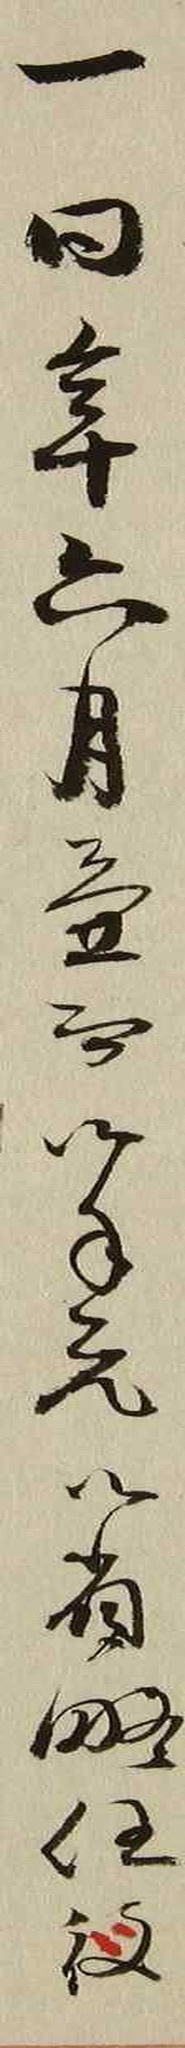一同年六月兼而御手元御省略任仮
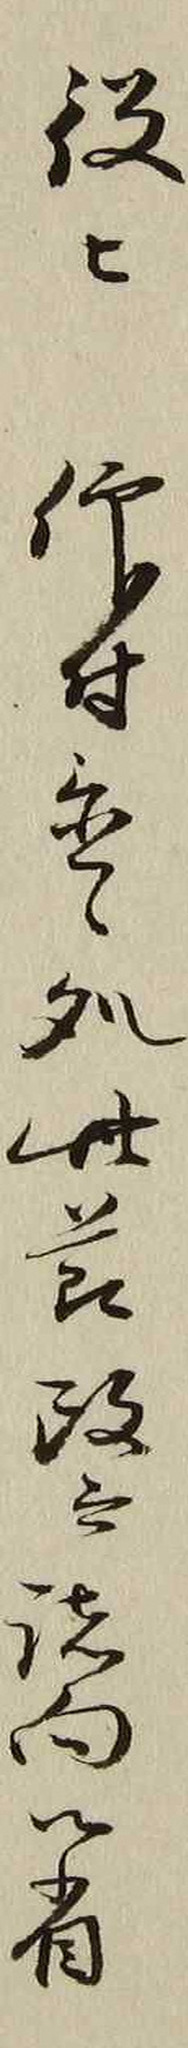役被仰付置候処此節改而諸向御省
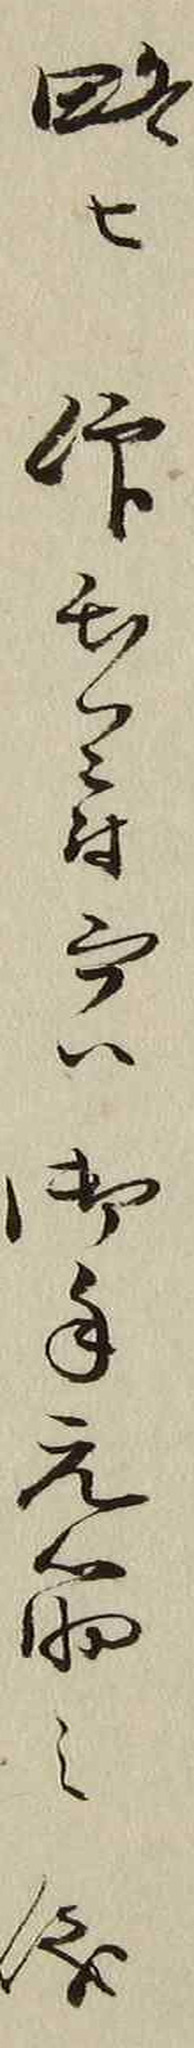略被仰出候に付而は御手元筋之儀
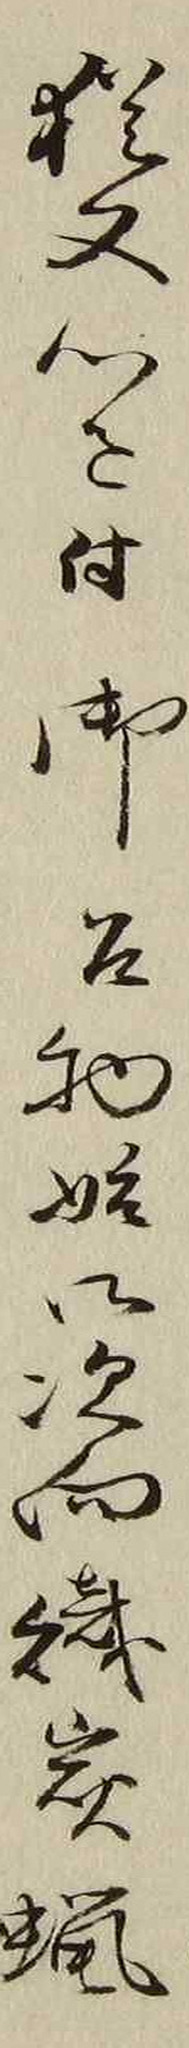猶又心を付御召物始御次向織炭蝋
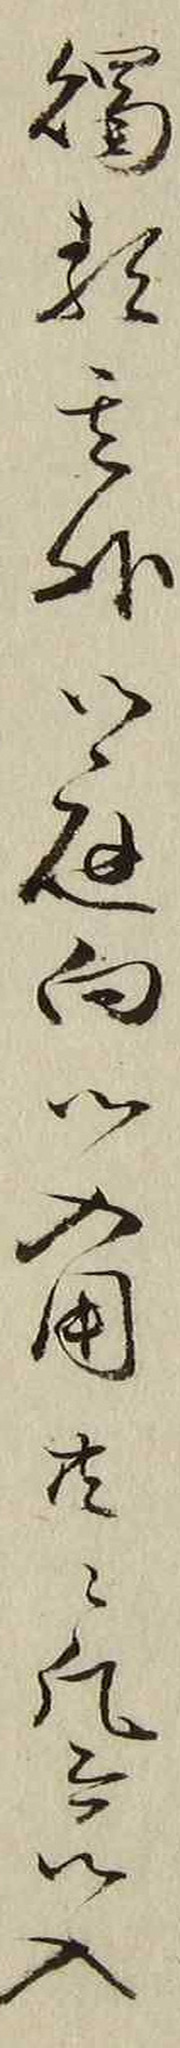燭類其外御庭向御入用共に凡而御入
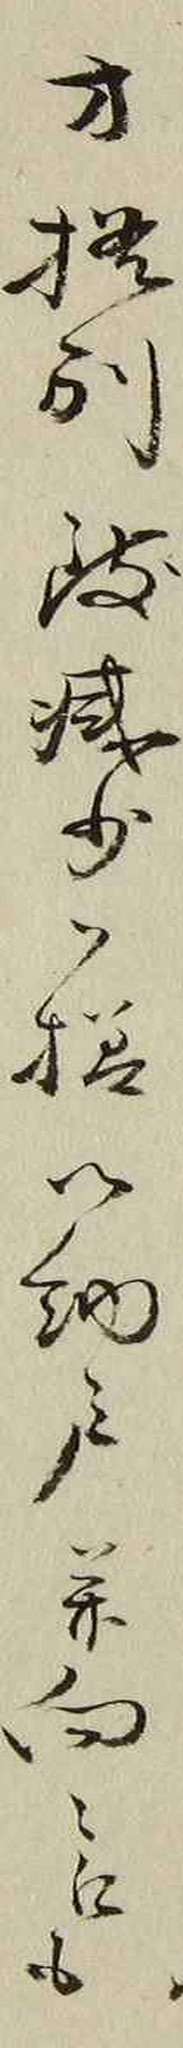方格別致減少候様御納戸并向々江も
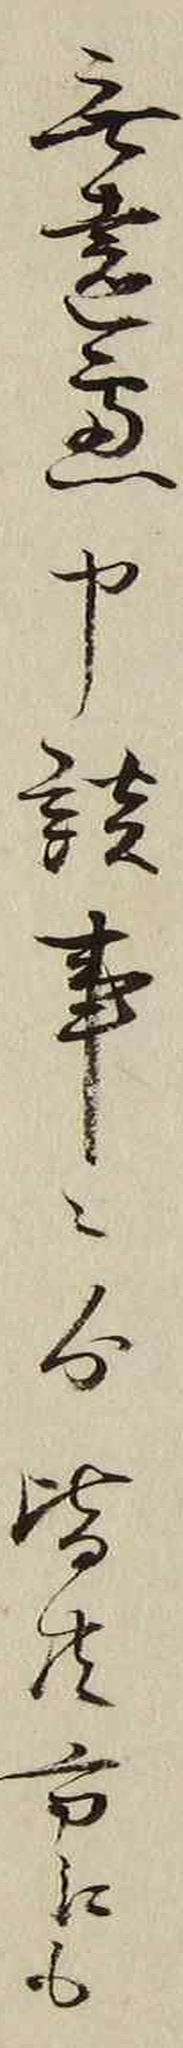無遠慮申談事にゟ皆共方江も
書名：諸士系譜　巻之292　き之部1
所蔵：会津若松市立会津図書館
